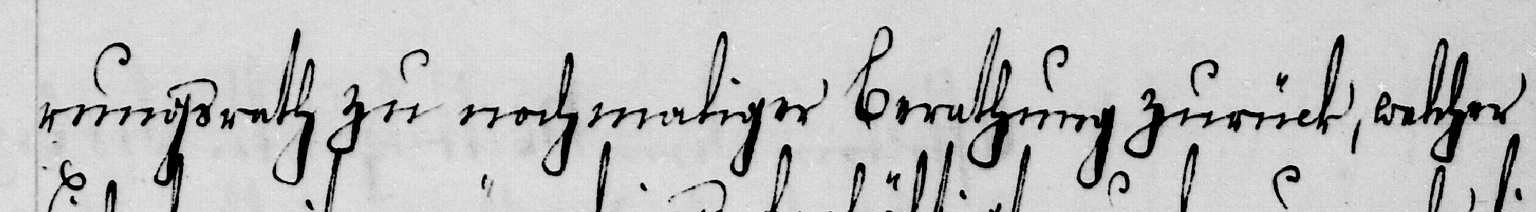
rungsrath zu nochmaliger Berathung zurück, welcher
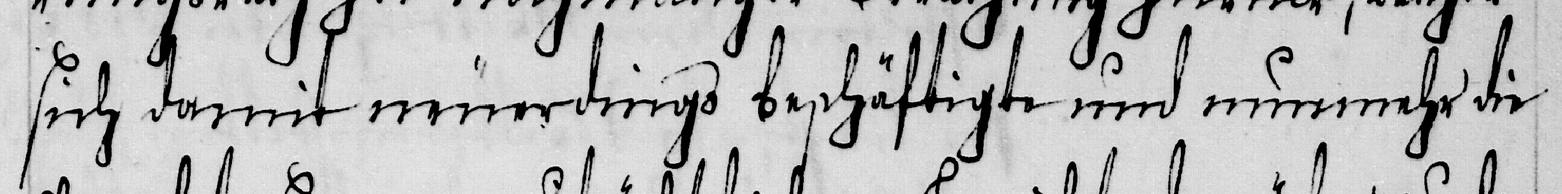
sich damit neuerdings beschäftigte und nunmehr die
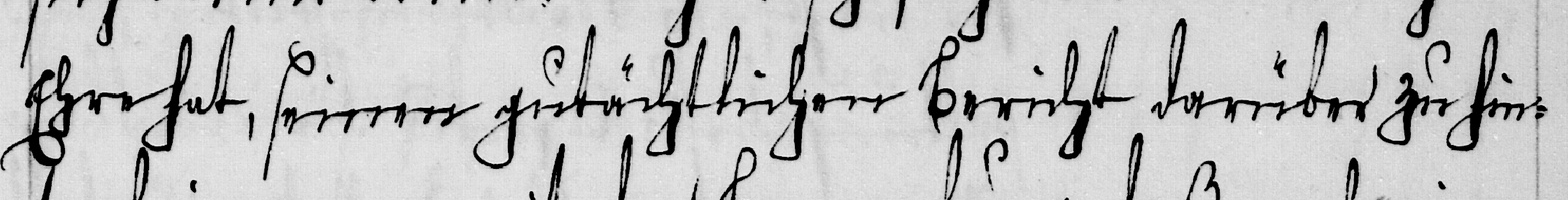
Ehre hat, seinen gutächtlichen Bericht darüber zu hin¬
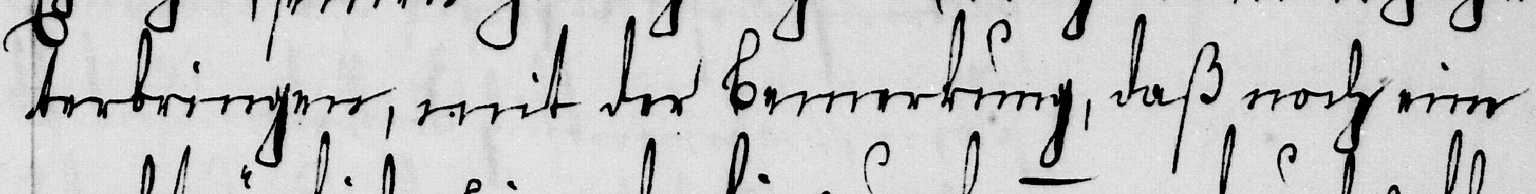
terbringen, mit der Bemerkung, daß noch eine
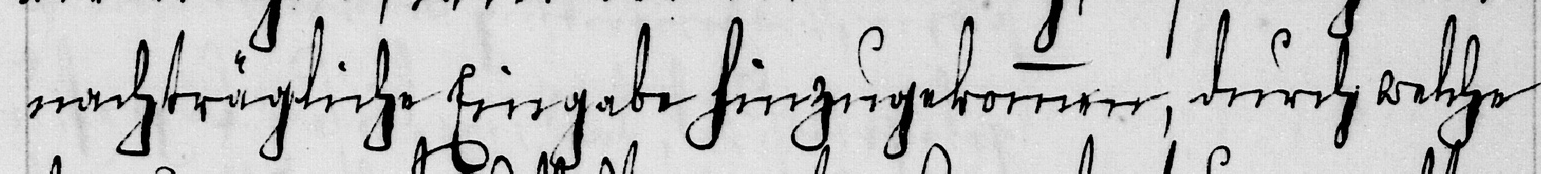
nachträgliche Eingabe hinzugekommen, durch welche
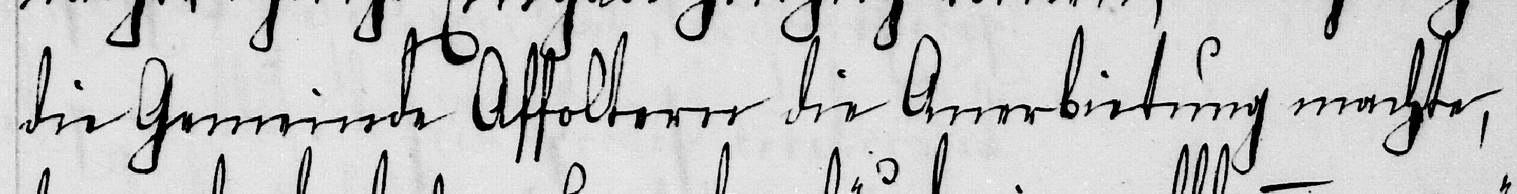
die Gemeinde Affoltern die Anerbietung machte,
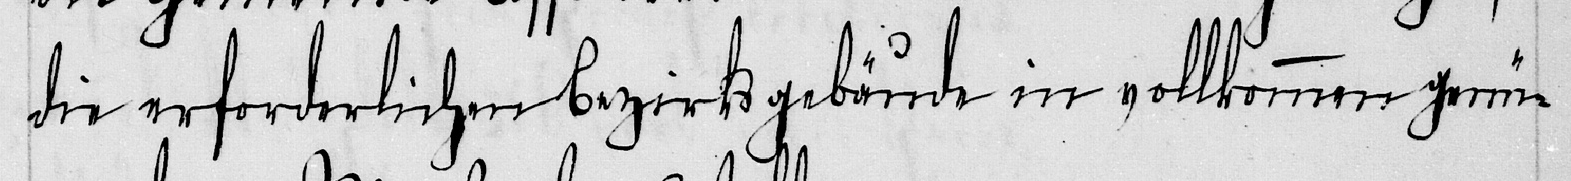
die erforderlichen Bezirksgebäude in vollkommen genü¬
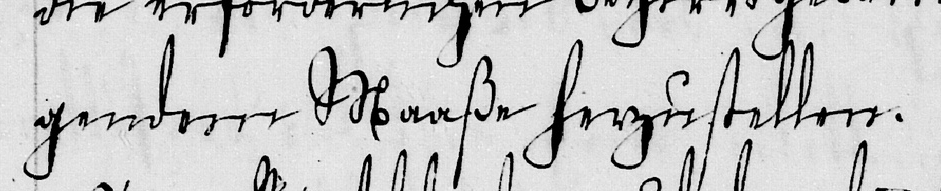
gendem Maaße herzustellen.
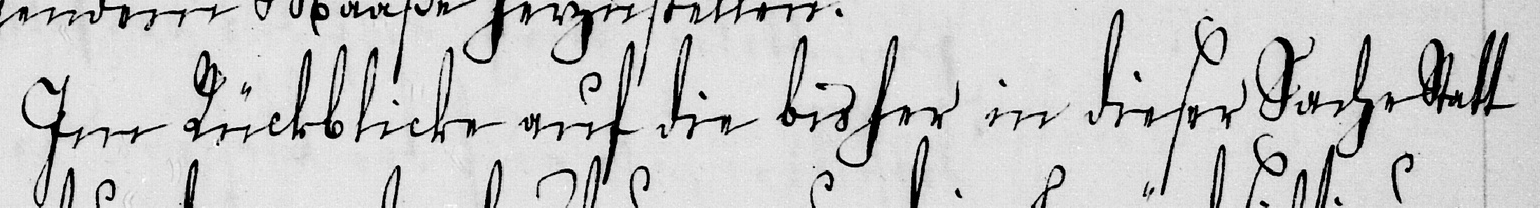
Im Rückblick auf die bisher in dieser Sache St¬
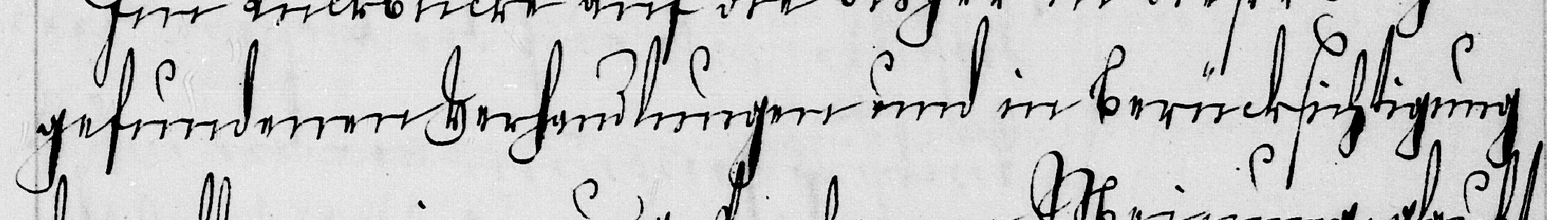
gefundenen Verhandlungen und in Berücksichtigung
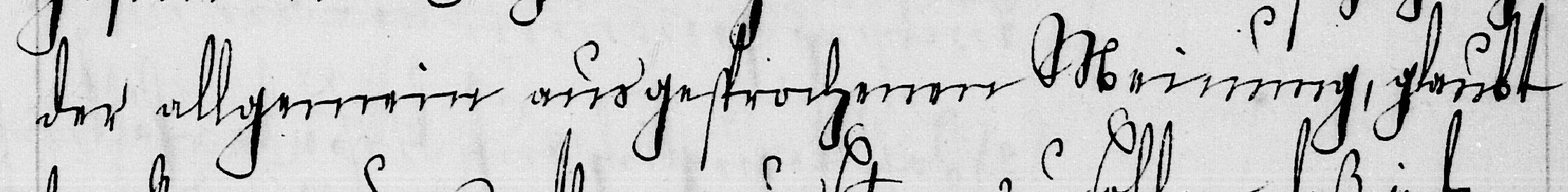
der allgemein ausgesprochenen Meinung, glaubt
